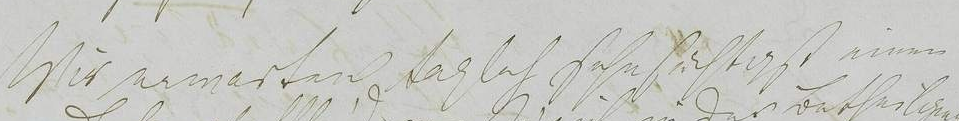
Wir erwarten täglich sehnsüchtigst einen
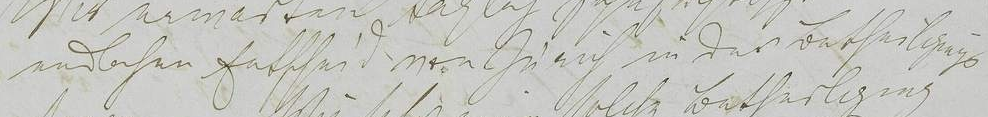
endlichen Entscheid von Zürich in der Betheiligungs-
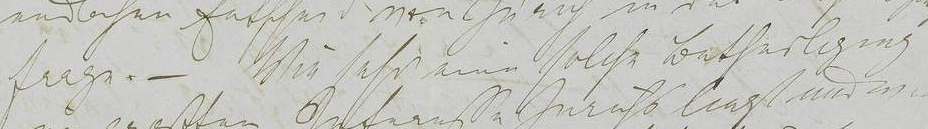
frage . – Wie sehr eine solche Betheiligung
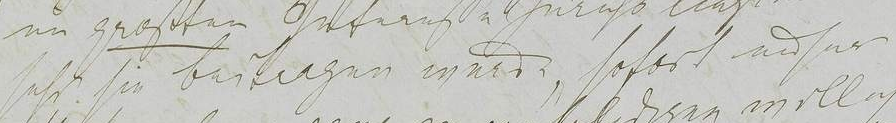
sehr sie beitragen würde, sofort unser
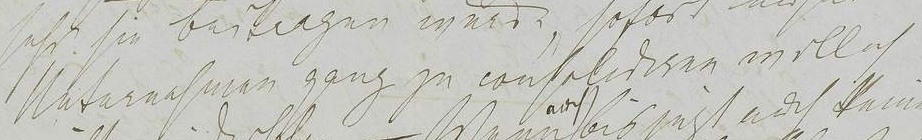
Unternehmen ganz zu consolidiren will ich
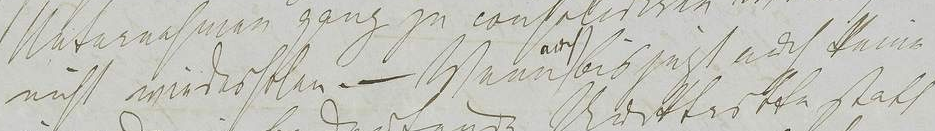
nicht wiederholen. – Wenn auch bis jezt auch keine
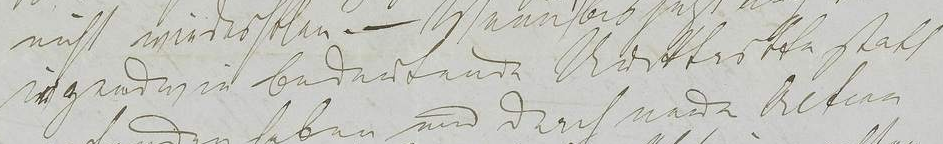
irgendwie bedeutende Rücktritte statt
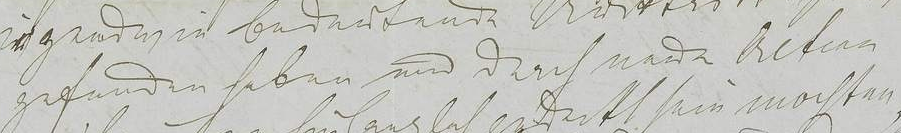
gefunden haben und durch neue Actien-
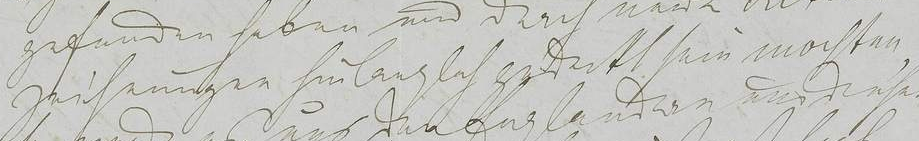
zeichnungen hinlänglich gedeckt sein mochten,
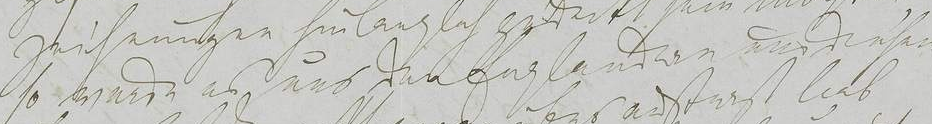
so würde es uns den Engländern und diesen
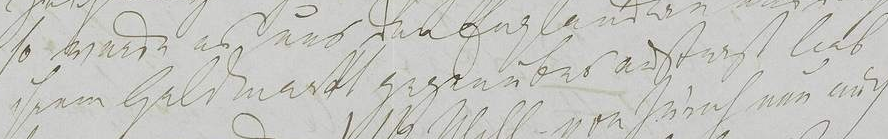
ihrem Geldmarkt gegenüber äußerst lieb
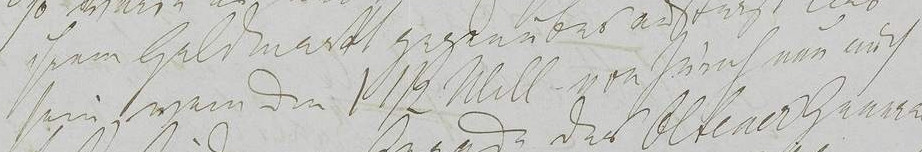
sein, wenn die 1½ Mill. von Zürich nun auch
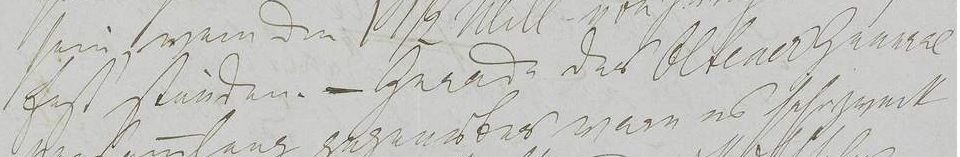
fest stünden. – Gerade der Oltener General-
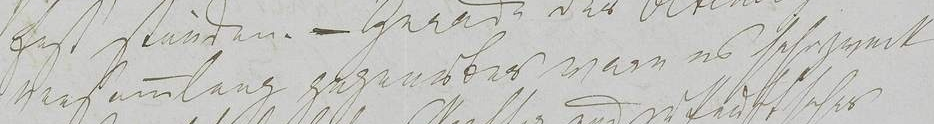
versammlung gegenüber wäre es sehr zweck-
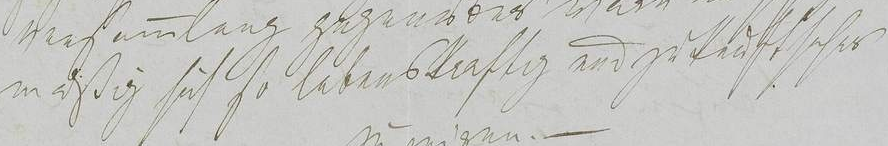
mäßig sich so lebenskräftig und zukunftsicher
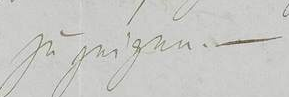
zu zeigen.
